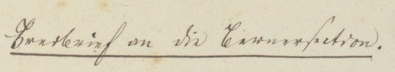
Freibrief an die Bernersection.
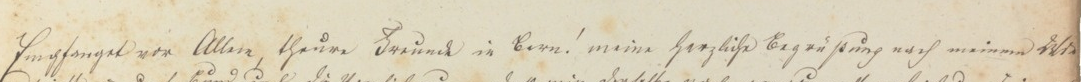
Empfanget vor Allem, theure Freunde in Bern! meine herzliche Begrüßung nach meinem Wie-
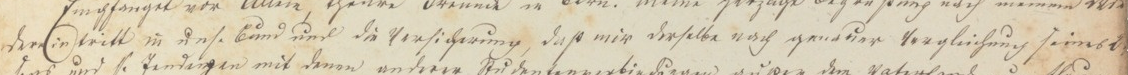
dereintritt in uns. Bund und die Versicherung, daß mir derselbe nach genauer Vergleichung seines We-
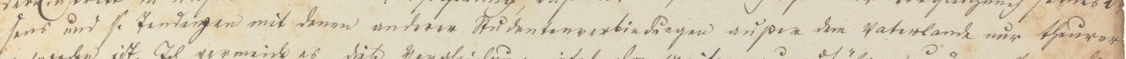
sens und s. Tendenzen mit denen anderer Studentenverbindungen außer dem Vaterlande nur theurer
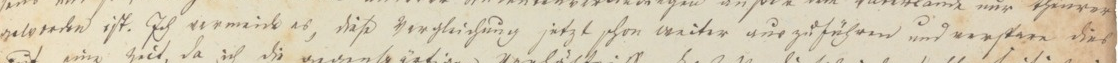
geworden ist. Ich vermeide es, diese Vergleichung jetzt schon weiter auszuführen und verspare dies
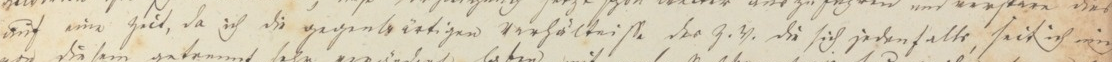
auf eine Zeit, da ich die gegenwärtigen Verhältnisse des Z.V. die sich jedenfalls, seit ich mich
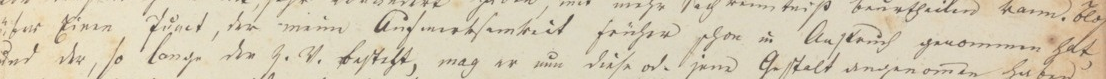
über Einen Punct, der meine Aufmerksamkeit früher schon in Anspruch genommen hat,
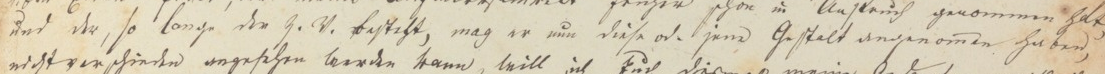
und der, so lange der Z.V. besteht, mag er nun diese od. jene Gestalt angenommen haben,
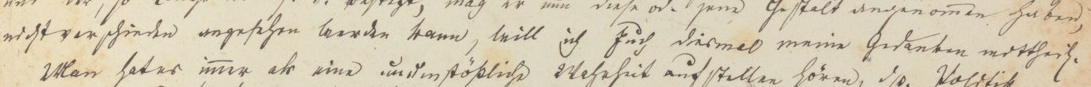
nicht verschieden angesehen werden kann, will ich Euch diesmal meine Gedanken mittheilen.
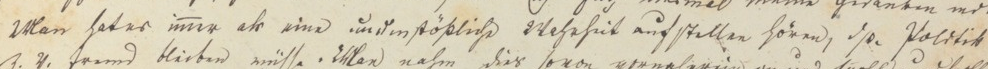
Man hat es immer als eine unumstößliche Wahrheit aufstellen hören, dß. Politik
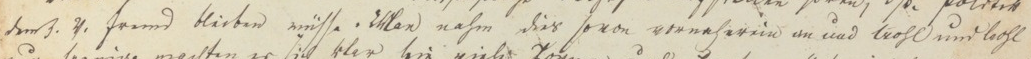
dem Z.V. fremd bleiben müsse. Man nahm dies so von vornherein an und wohl und wohl
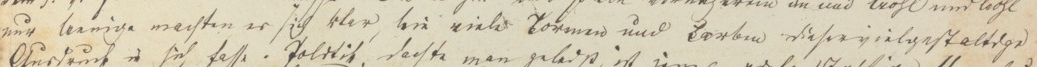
nur wenige machten es sich klar, wie viele Formen und Farben dieser vielgestaltige
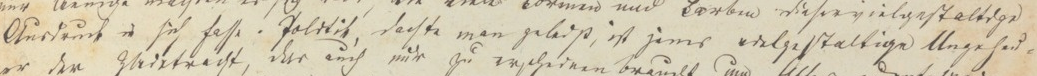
Ausdruck in sich fasse. Politik, dachte man gewiß, ist jenes vielgestaltige Ungeheu-
